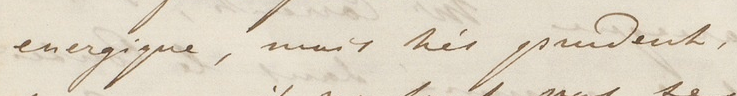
energique, mais très prudent,
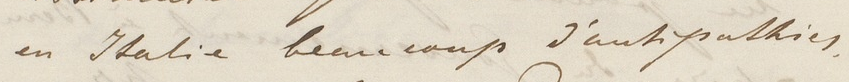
en Italie beaucoup d'antipathies,
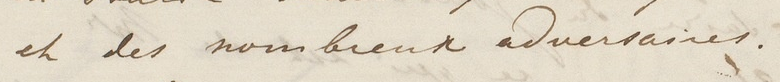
et des nombreux adversaires.
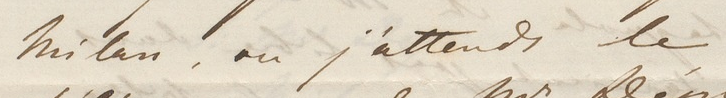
Milan, ou j'attends le
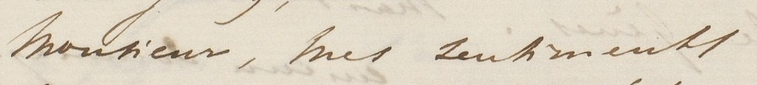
Monsieur, mes sentiments
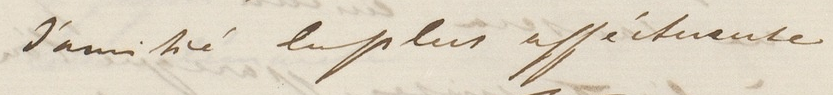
d'amitié la plus afféctueuse
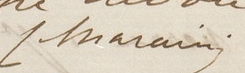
C Maraini
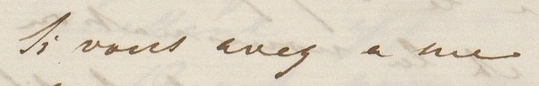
Si vous avez a me
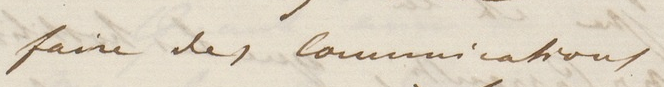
faire des communications
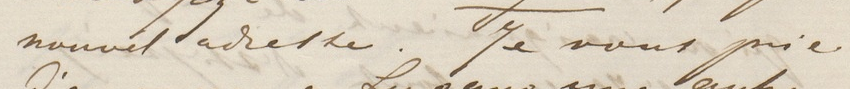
nouvel adresse. Je vous prie
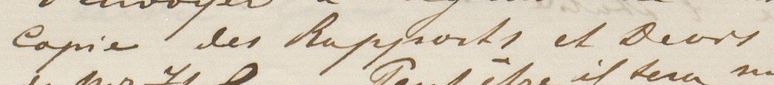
Copie des Rapports et Devis
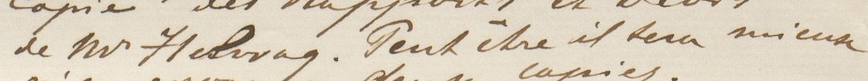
de MrHelwag. Peut être il sera mieux
